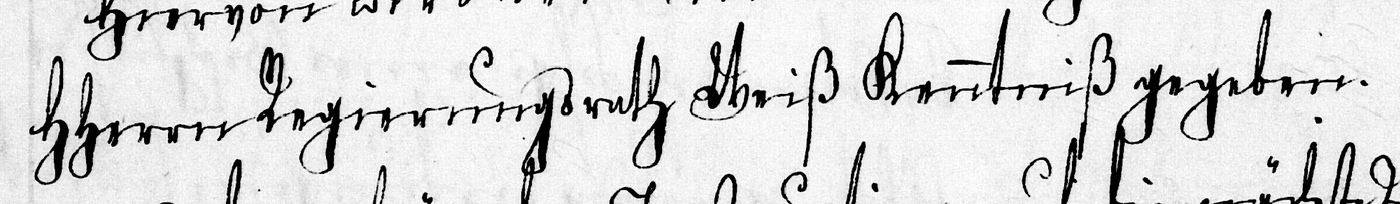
HHerrn Regierungsrath Weiß Kenntniß gegeben.
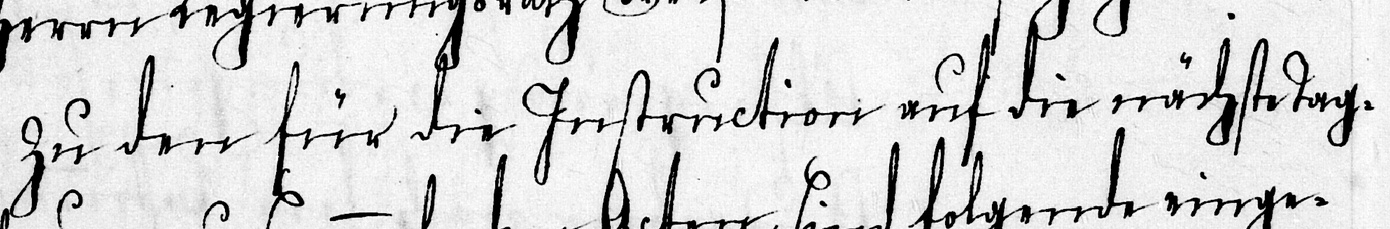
Zu den für die Instruction auf die nächste Tag¬
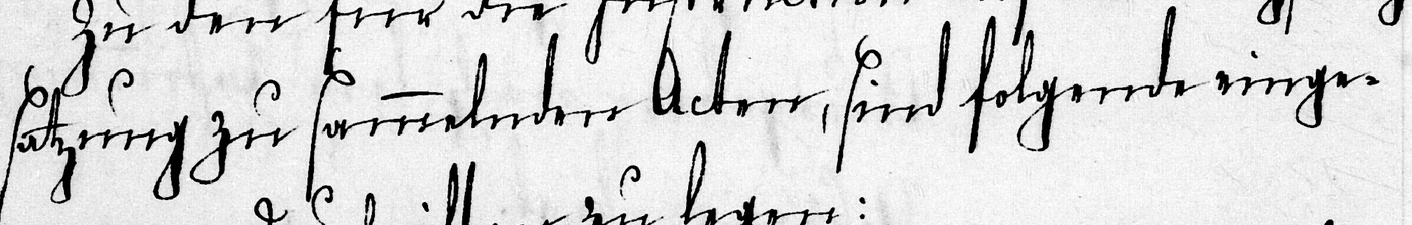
satzung zu sammelnden Acten, sind folgende einge¬
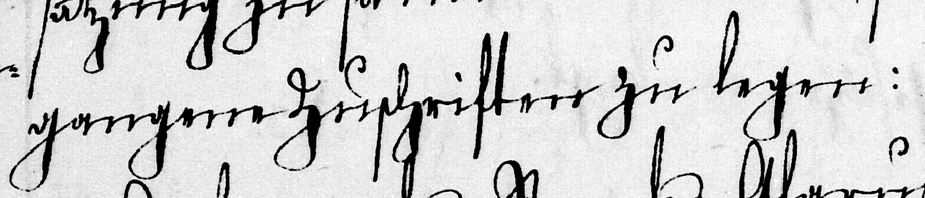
gangenen Zuschriften zu legen:
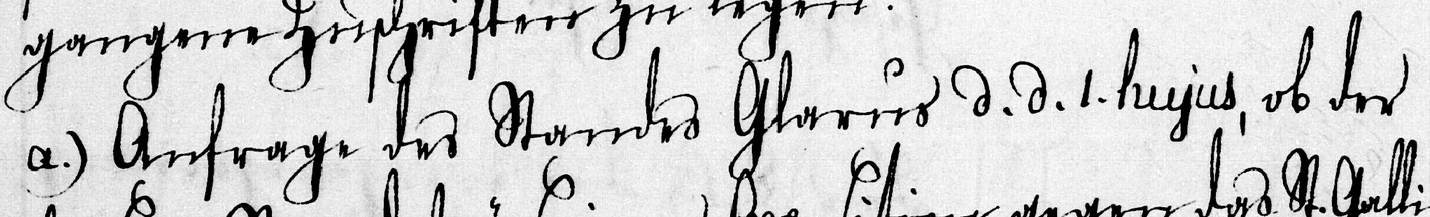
a.) Anfrage des Standes Glarus d. d. 1. hujus, ob der
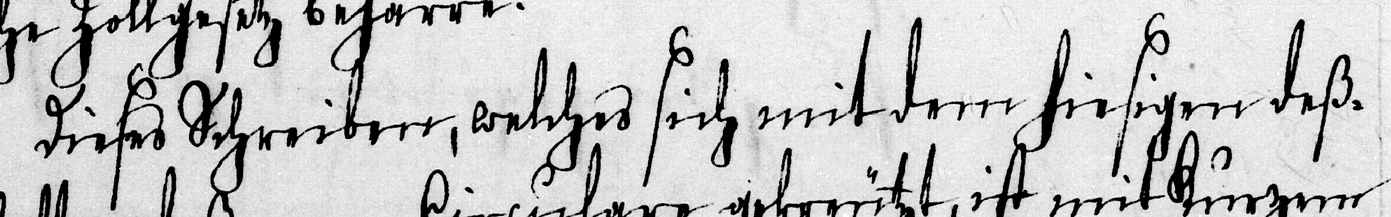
Dieses Schreiben, welches sich mit dem hiesigen deß¬
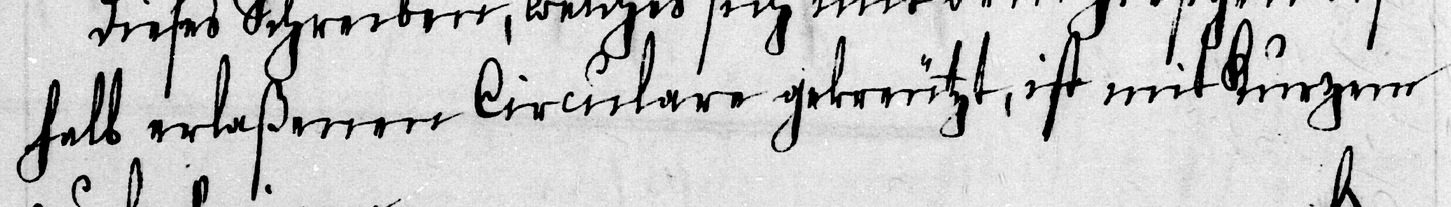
halb erlaßenen Circulare gekreutzt, ist mit Kurzem
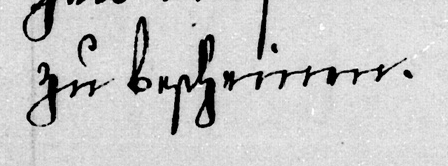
zu bescheinen.
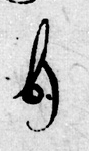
9.
